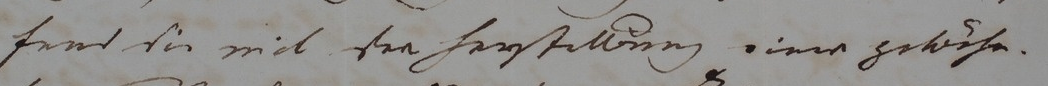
fend die mit der Erstellung einer gewöhn-
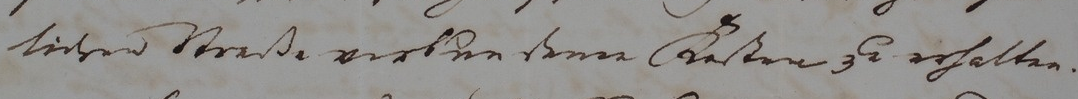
lichen Straße verbundenen Kosten zu erhalten.
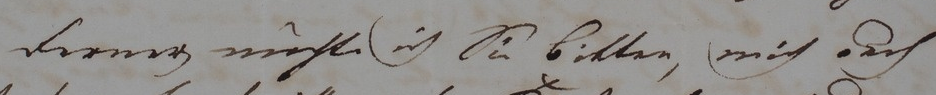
Ferner möchte ich Sie bitten, mich auch
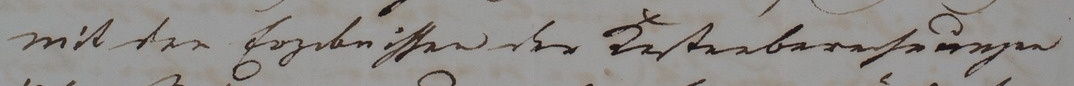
mit den Ergebnissen der Kostenberechnungen
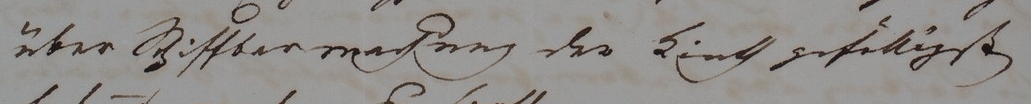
über Schiffbarmachung der Linth gefälligst
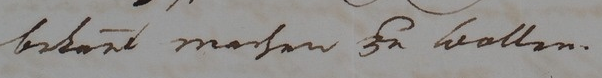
bekannt machen zu wollen.
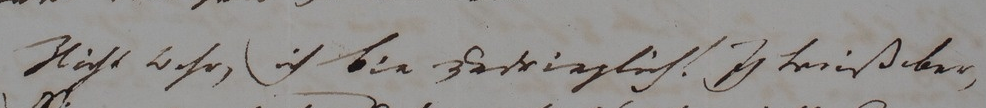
Nicht wahr, ich bin zudringlich! Ich weiss aber,
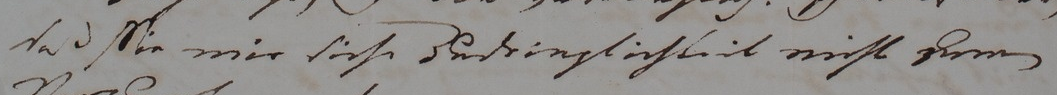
daß Sie mir diese Zudringlichkeit nicht zum
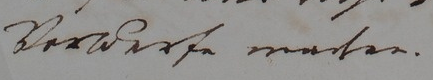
Vorwurfe machen.
